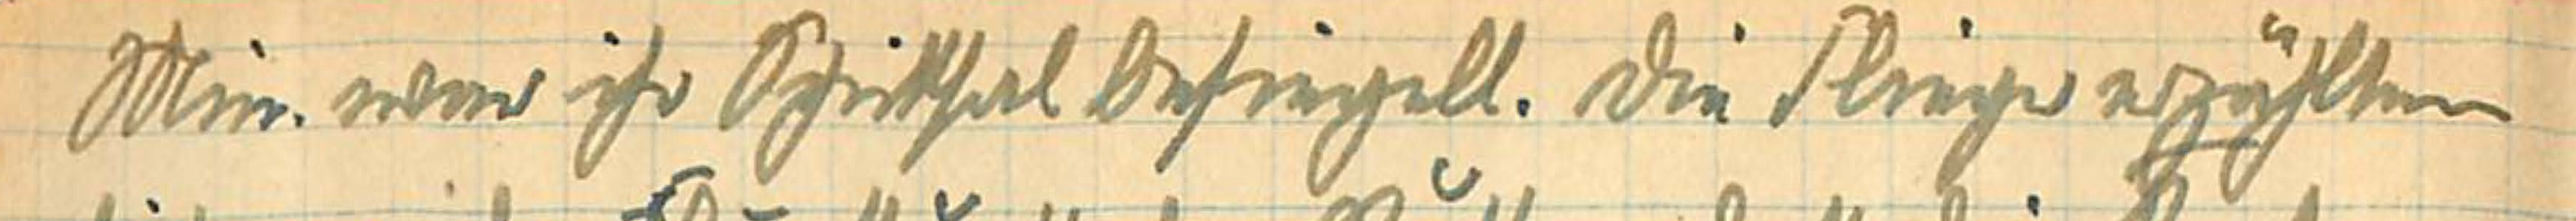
Min. war ihr Schicksal besiegelt. Die Flieger erzählten
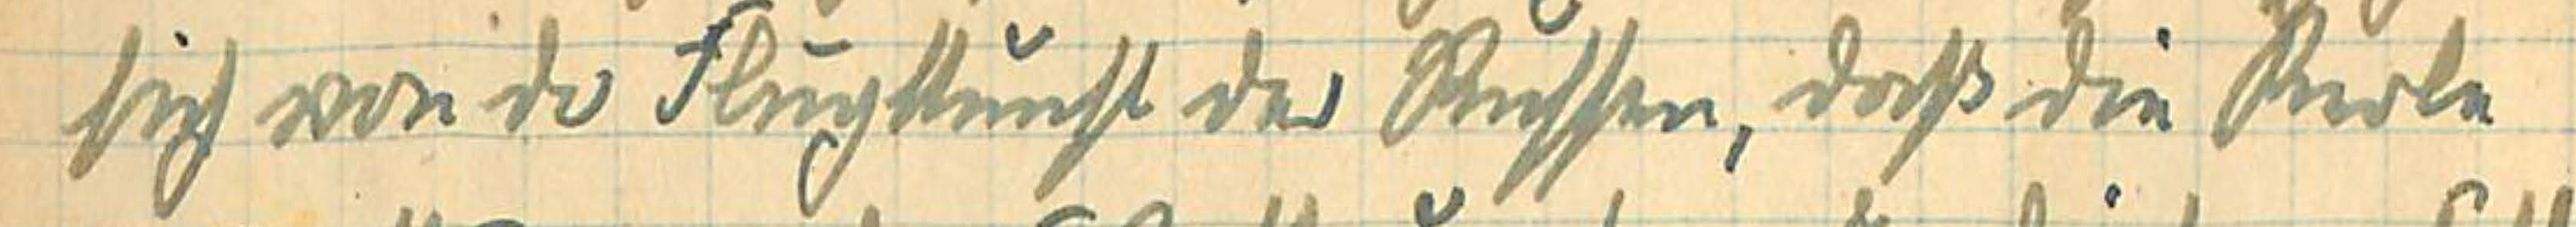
sich von der Flugkunst der Russen, daß die Kerle
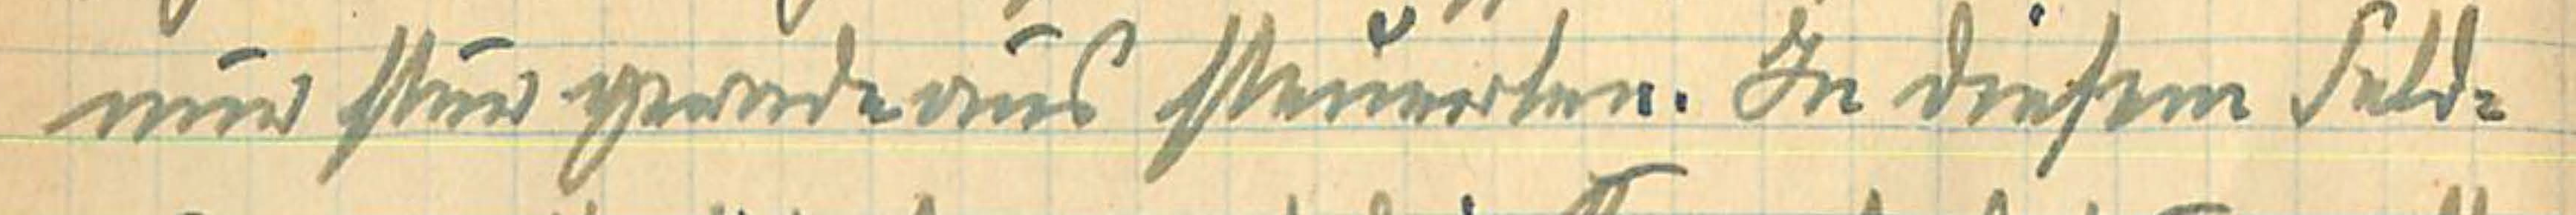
nur stur geradeaus steuerten. In diesem Feld-
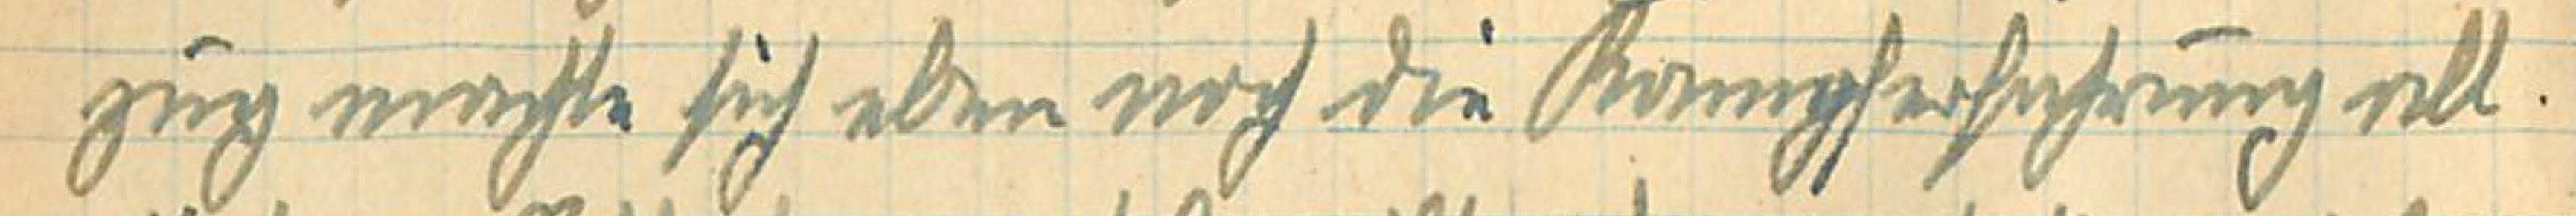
zug machte sich eben noch die Kampferfahrung all
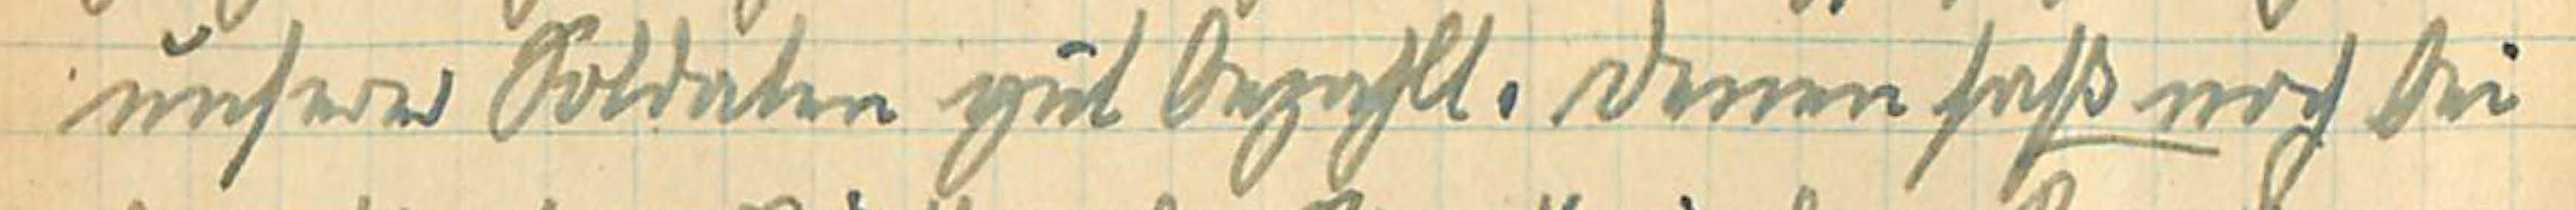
unserer Soldaten gut bezahlt. Denen saß noch bei
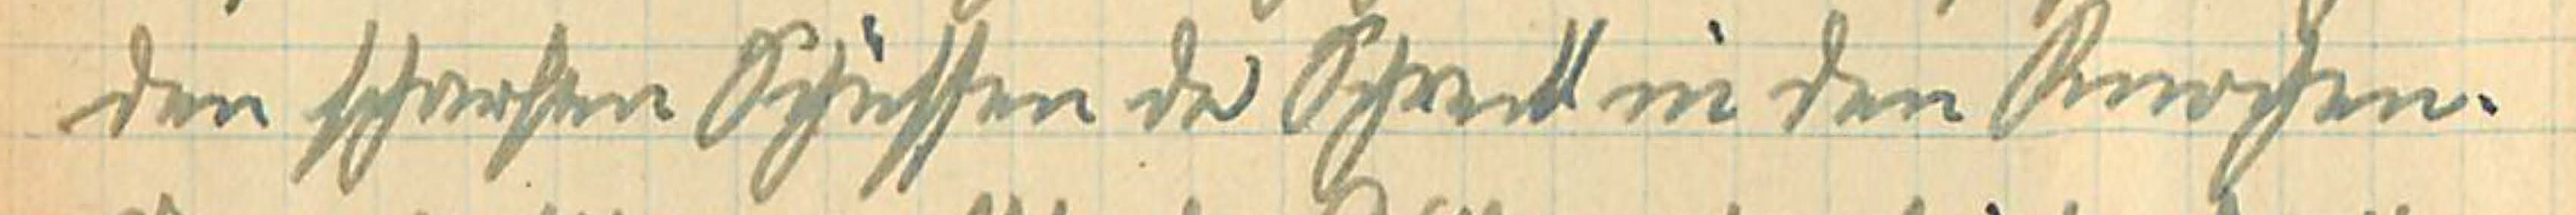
den scharfen Schüssen der Schreck in den Knochen.
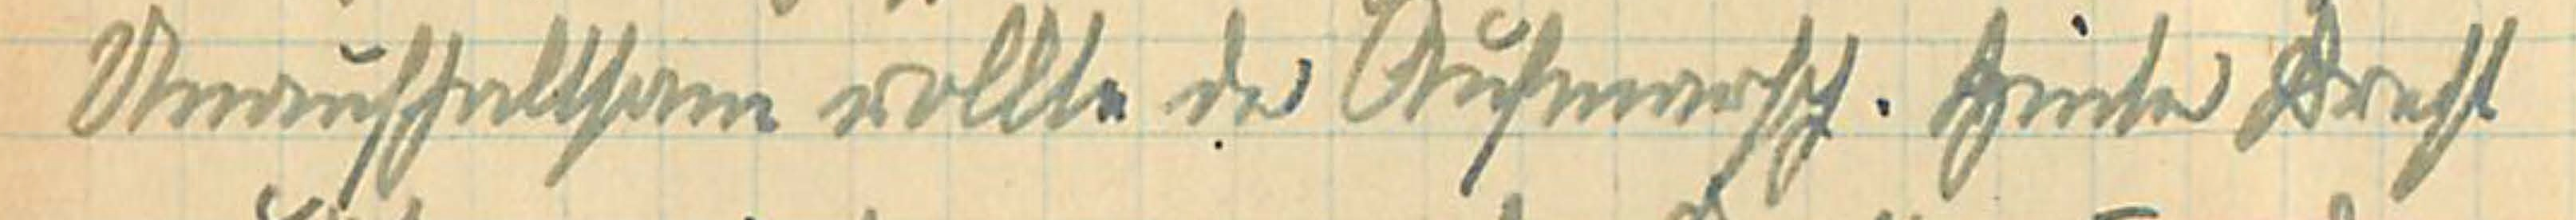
Unaufhaltsam rollte der Aufmarsch. Hinter Brest
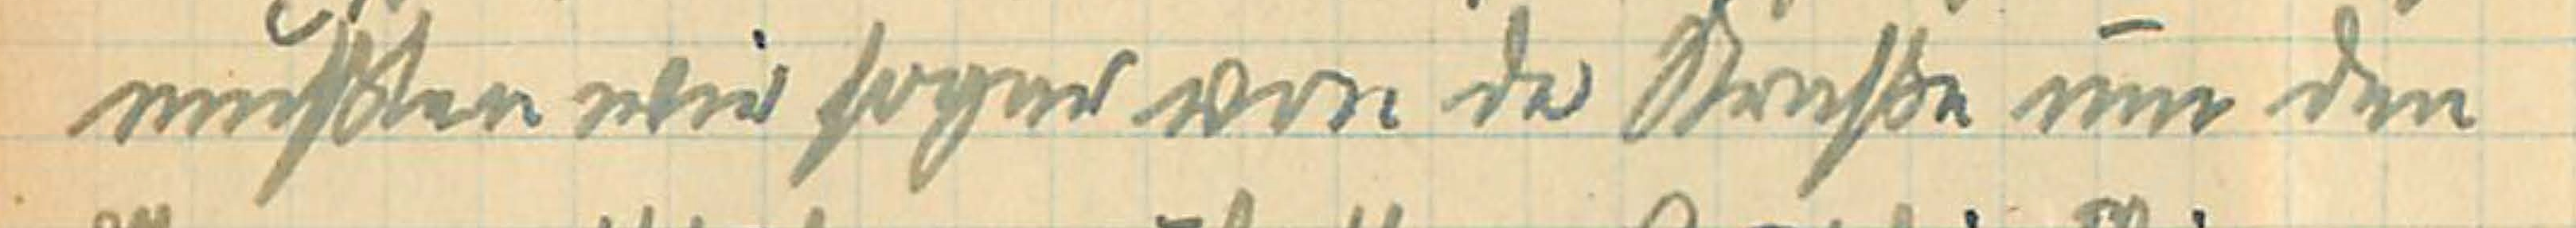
mußten wir sogar von der Straße um den
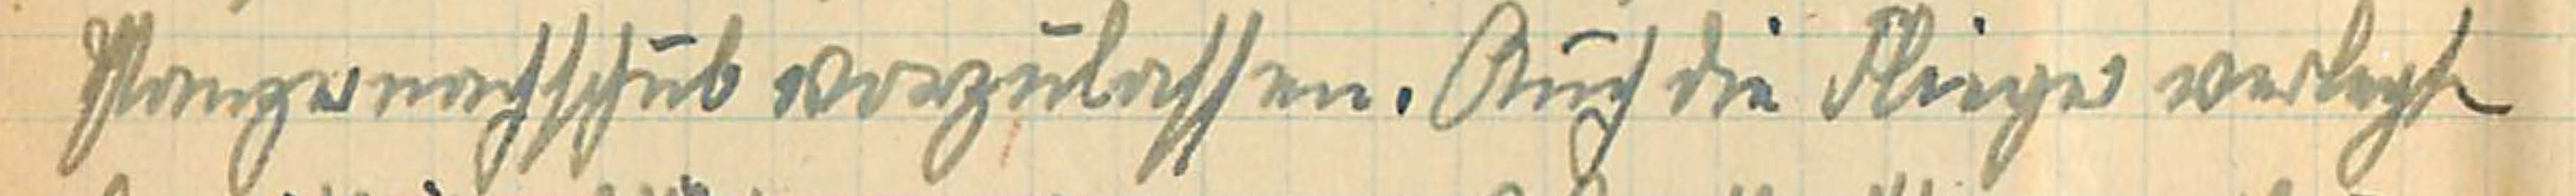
Panzernachschub vorzulassen. Auch die Flieger verlegten
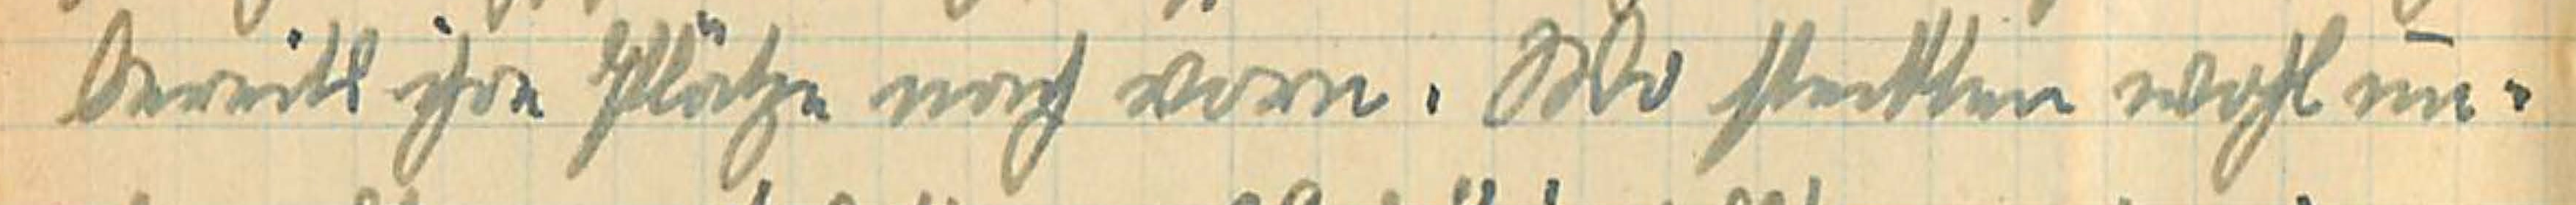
bereits ihre Plätze nach vorn. Wo steckten wohl un-
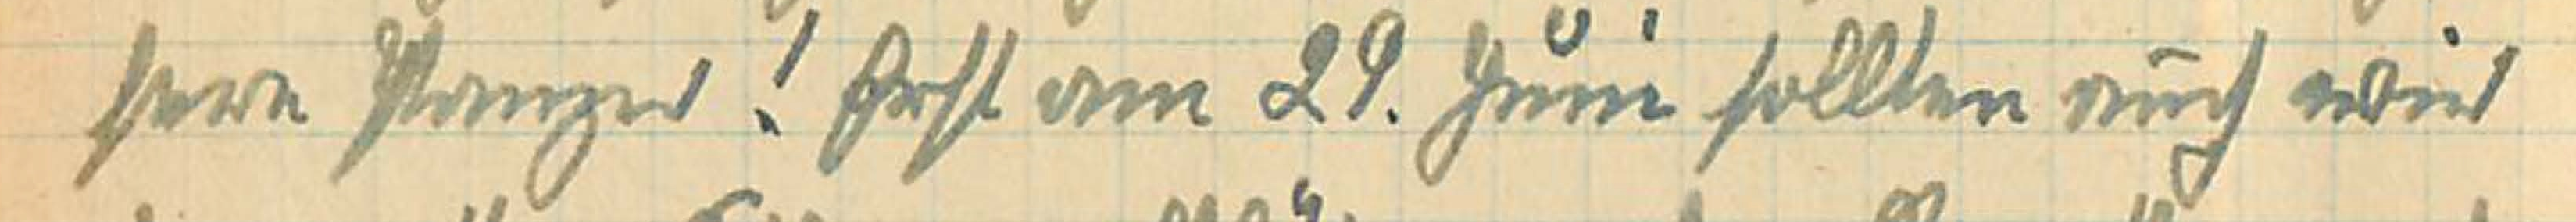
sere Panzer! Erst am 29. Juni sollten auch wir
